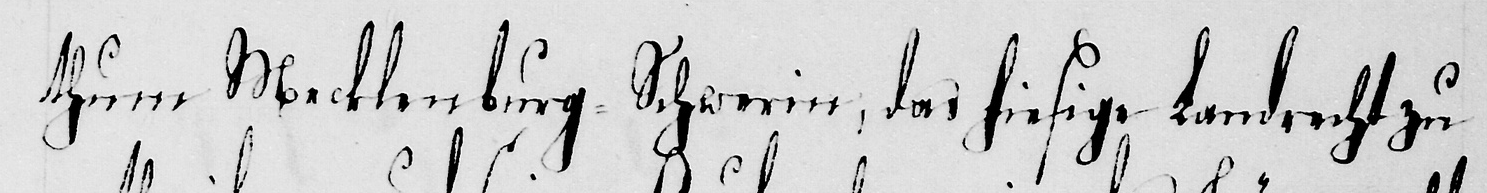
thum Mecklenburg-Schwerin, das hiesige Landrecht zu
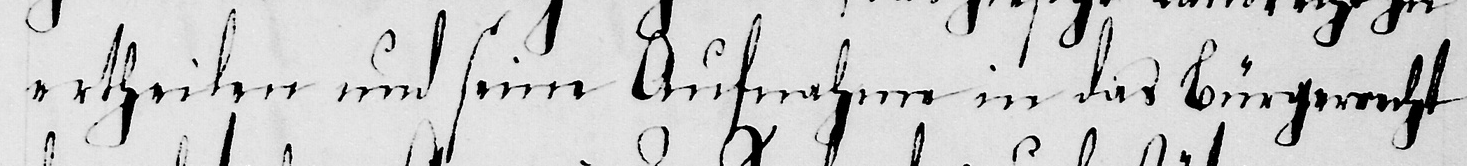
ertheilen und seine Aufnahme in das Bürgerrecht
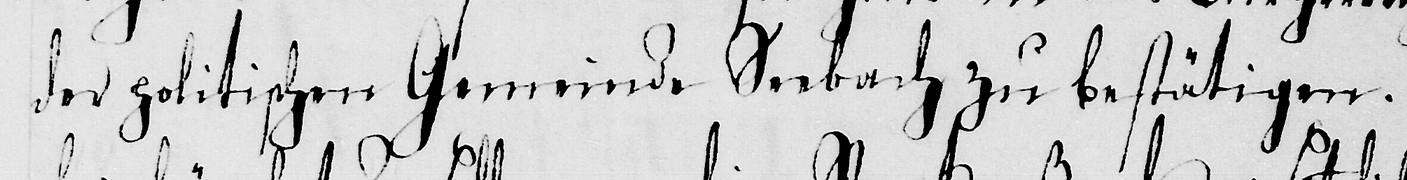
der politischen Gemeinde Seebach zu bestätigen.
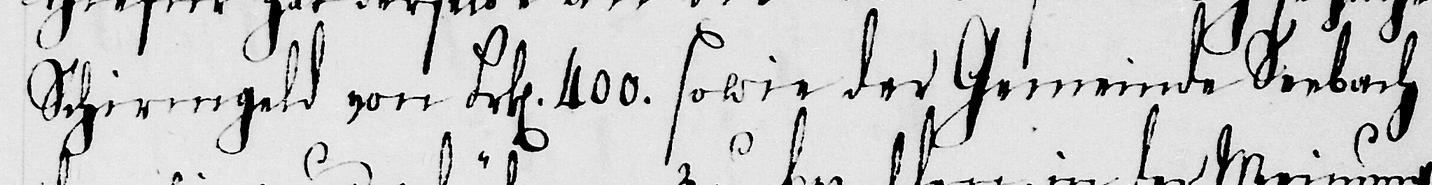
Schirmgeld von Frk[en] 400. sowie der Gemeinde Seebach
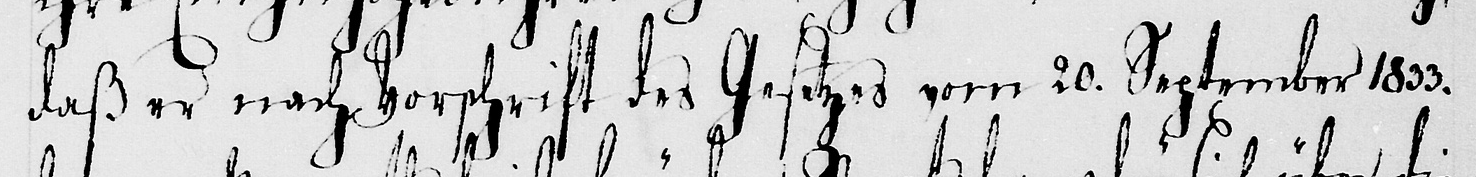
daß er nach Vorschrift des Gesetzes vom 20. September 1833.
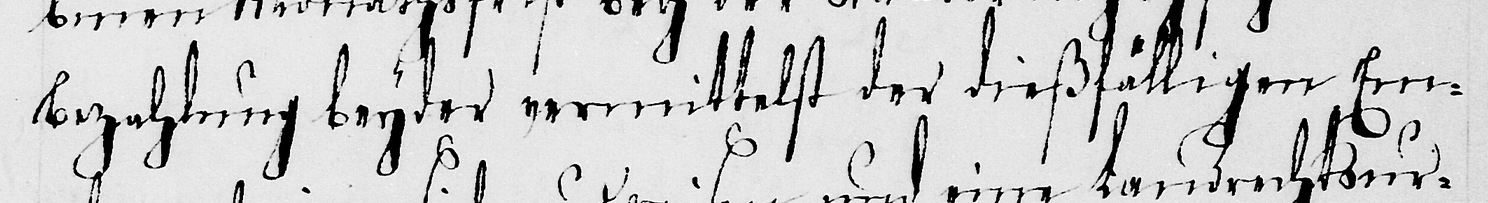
Bezahlung beyder vermittelst der dießfälligen Em¬
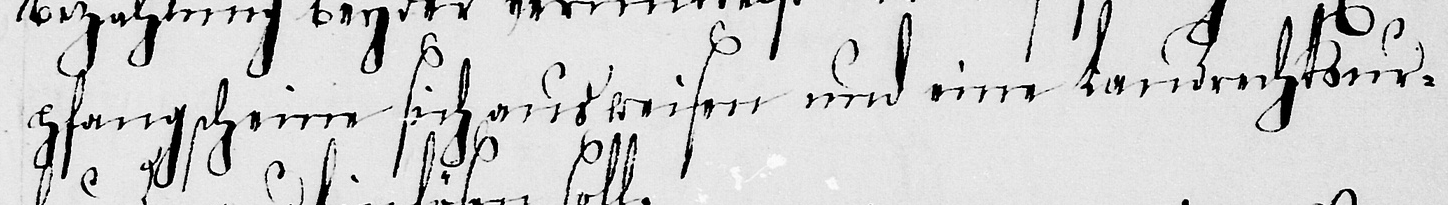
pfangsscheine sich ausweisen und eine Landrechtsur¬
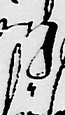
1.)
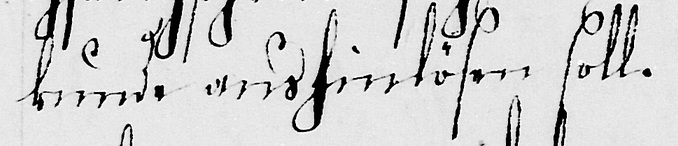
kunde aushinlösen soll.
